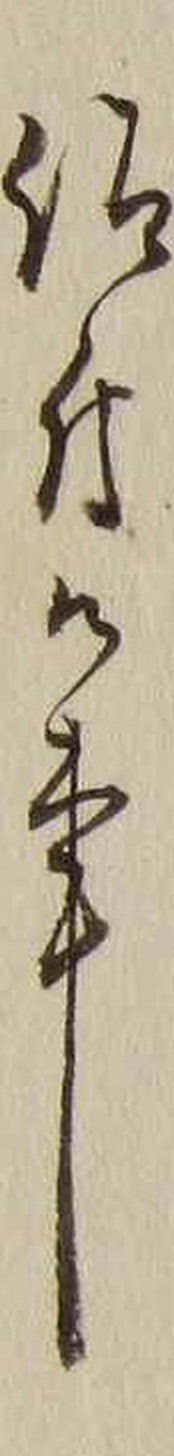仰付候事

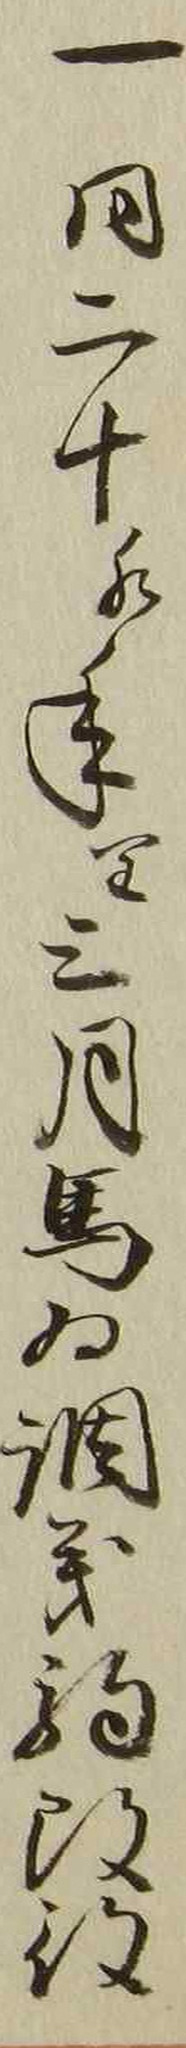一同二十卯年閏三月馬為調義駒改役
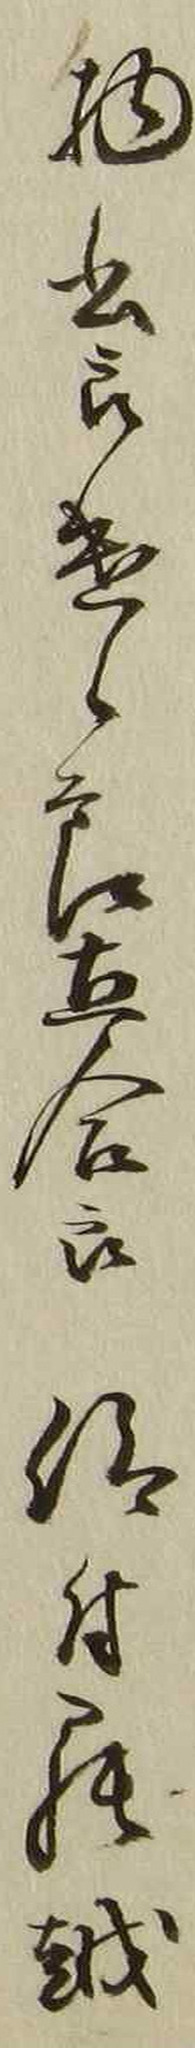物書被遣候節立合被仰付罷越
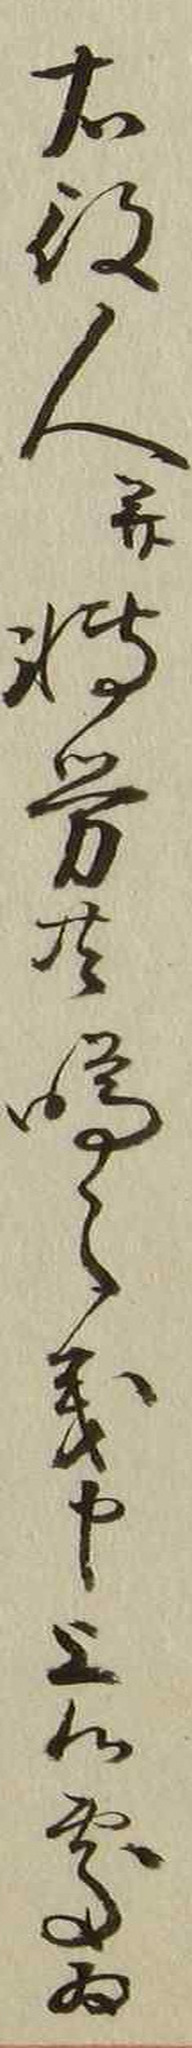右役人并博労共噂之義申上候処為
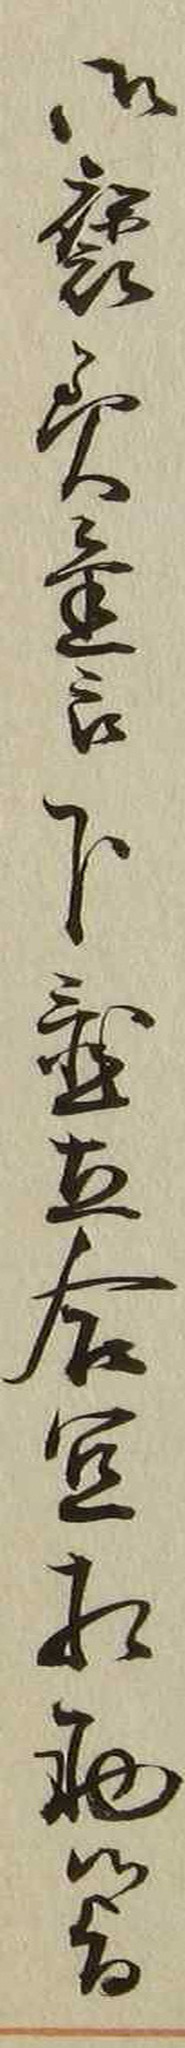御褒美金被下置立合宜相勤候旨
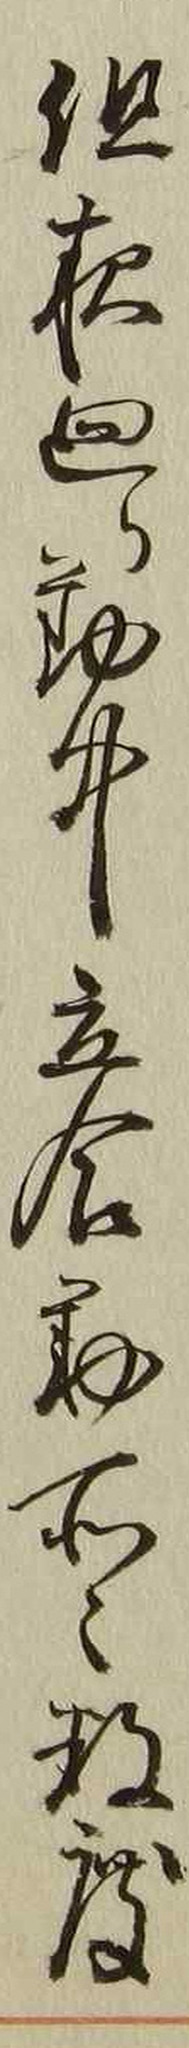但夜廻り勤中立合勤所々数度
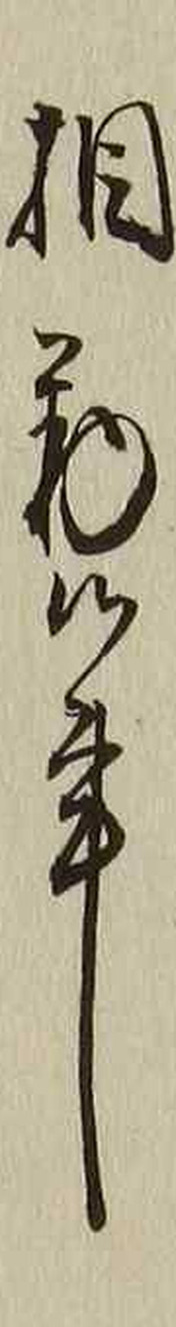相勤候事
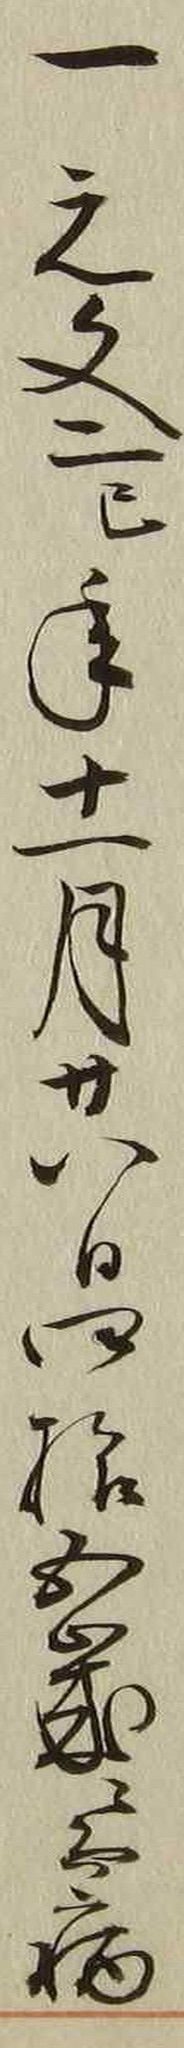一元文二巳年十一月廿八日四拾五歳ニ而病
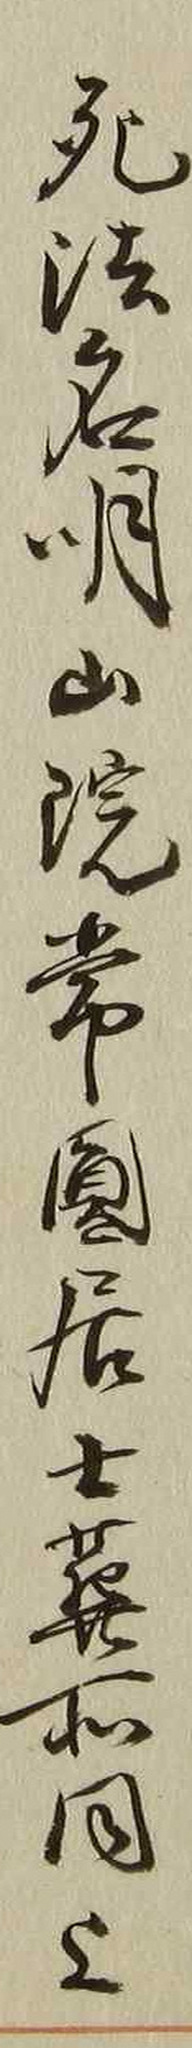死法名明山院常円居士葬所同上
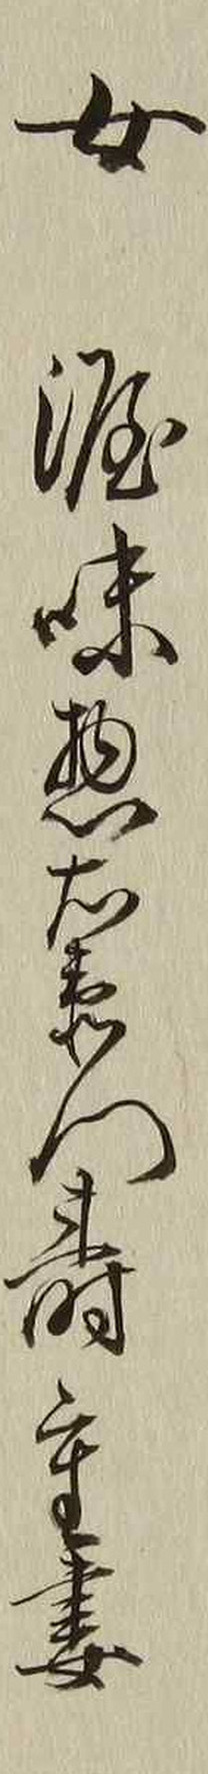女渥味惣右衛門寿重妻
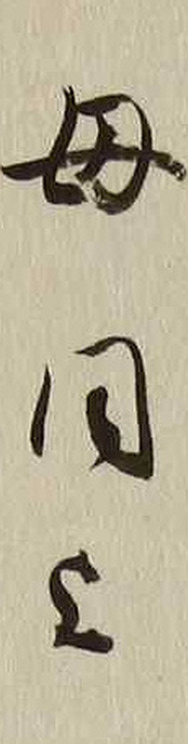母同上
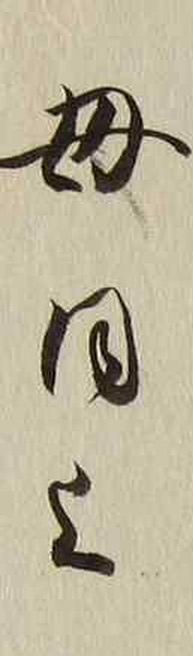母同上

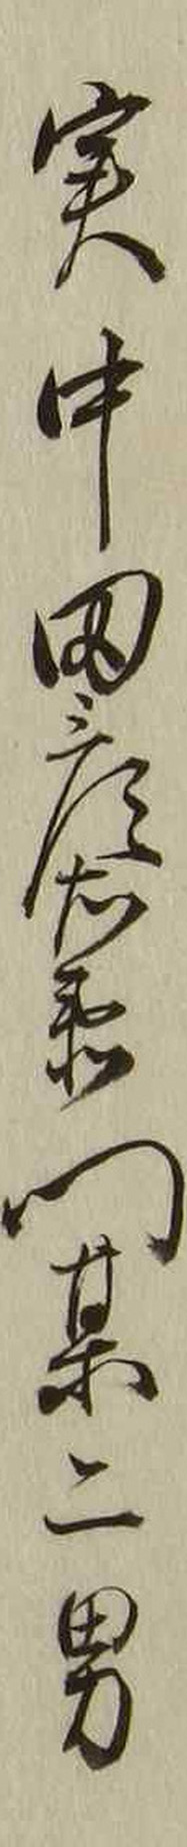実中田彦右衛門某二男
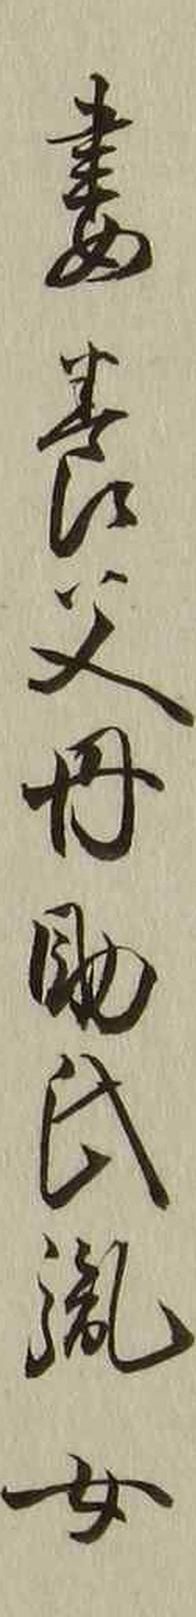妻養父丹助氏胤女
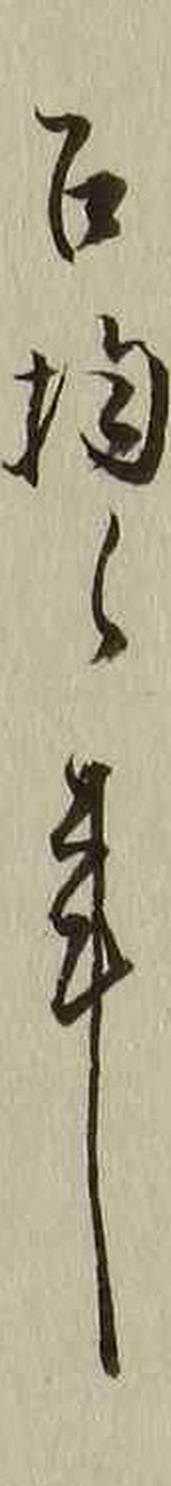召抱候事
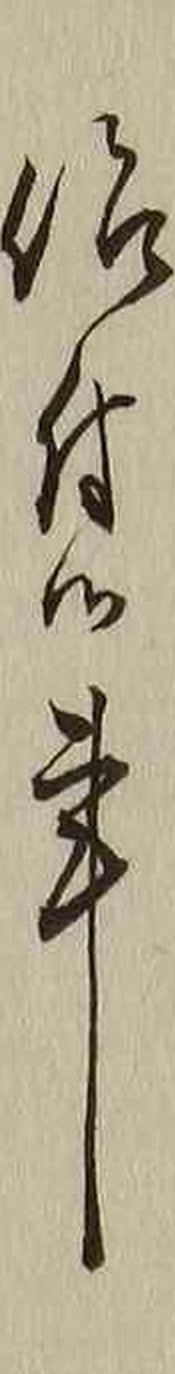仰付候事
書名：諸士系譜　巻之57　ほ之部4
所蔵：会津若松市立会津図書館
